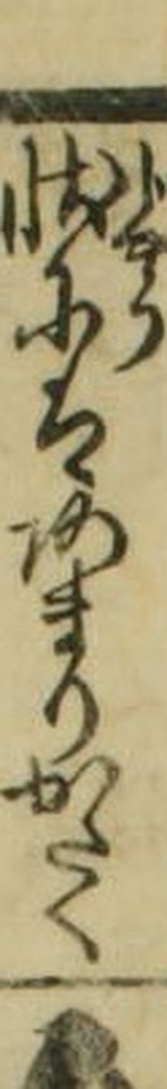状にはあまりかたく
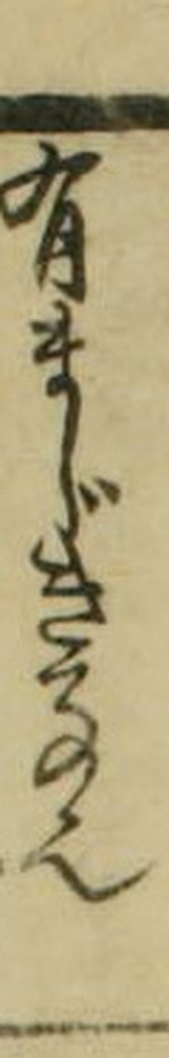有まじき事也
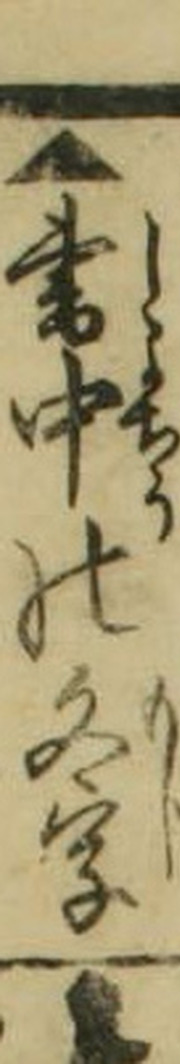▲書中の文字
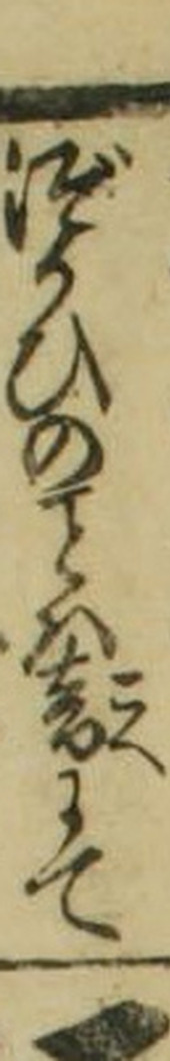づかひのことは音にて
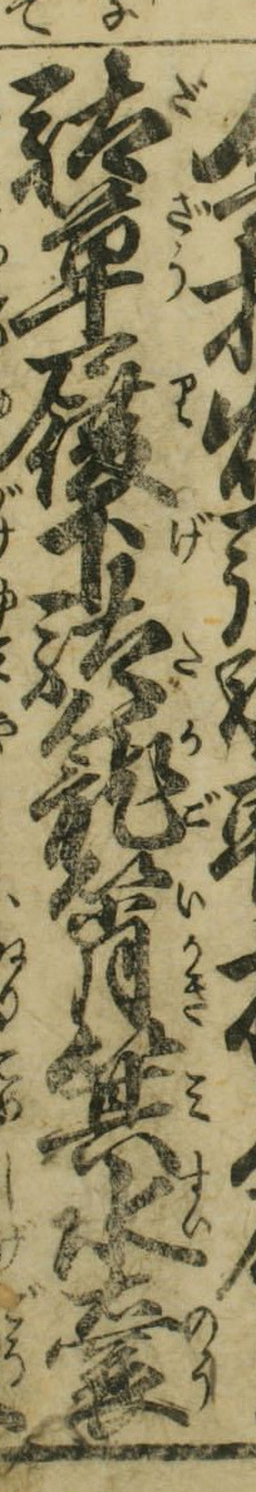駄草履下駄籠筲箕水嚢
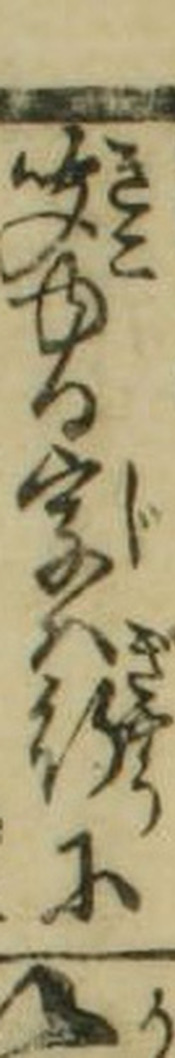聞ゆる字は行に
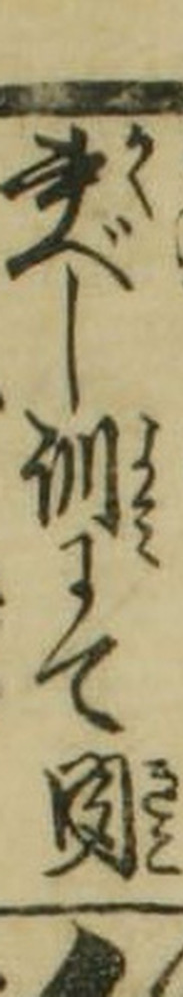書べし訓にて聞
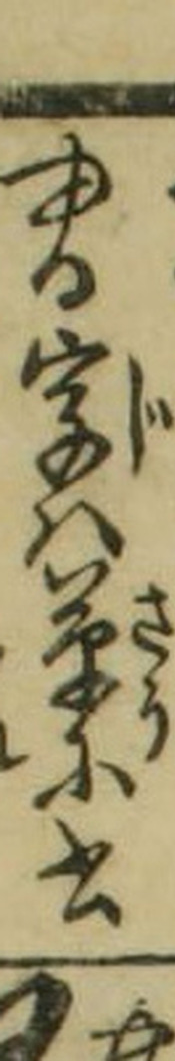ゆる字は草に書
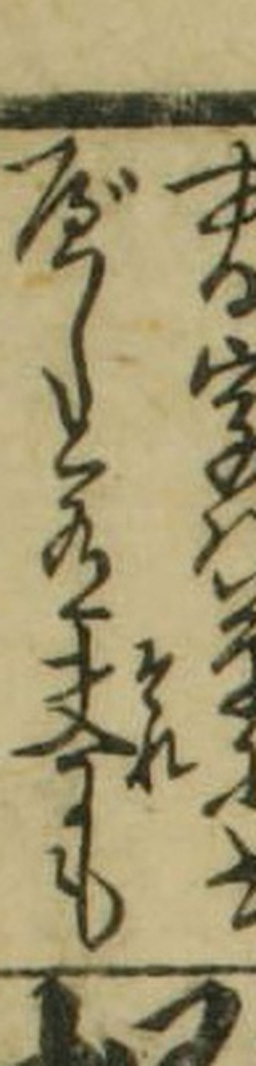べしと有夫にも
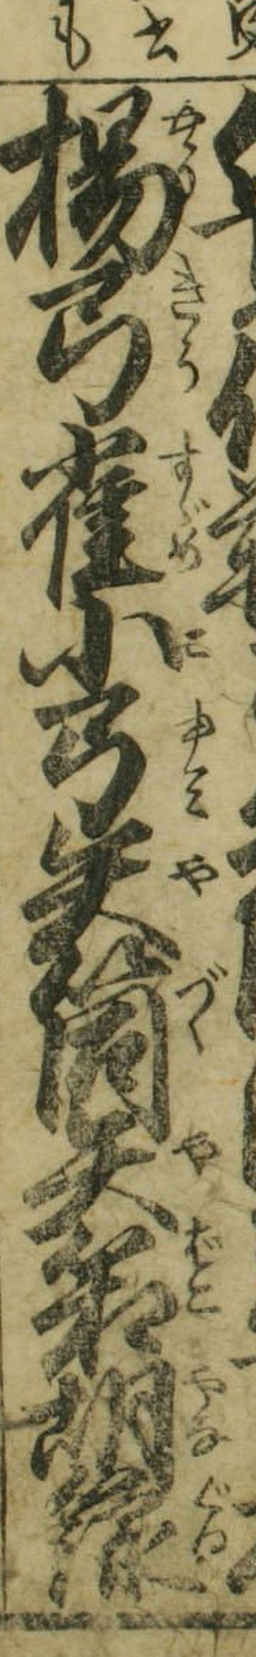楊弓雀小弓矢筒矢箱胡籙

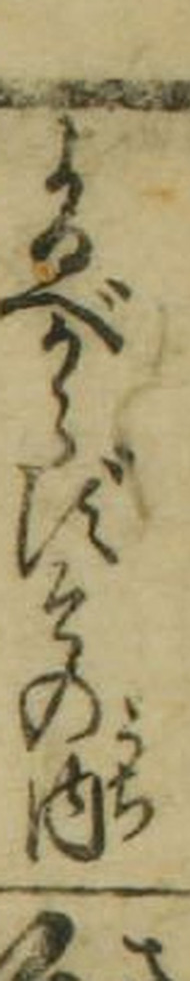よるべからずその内
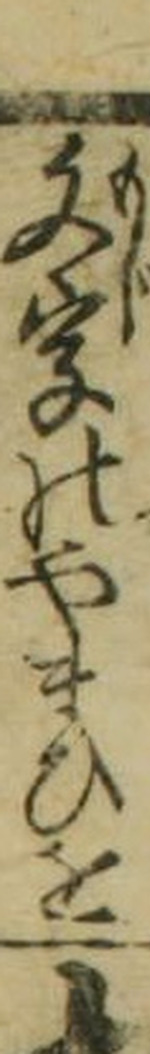文字のやまひを
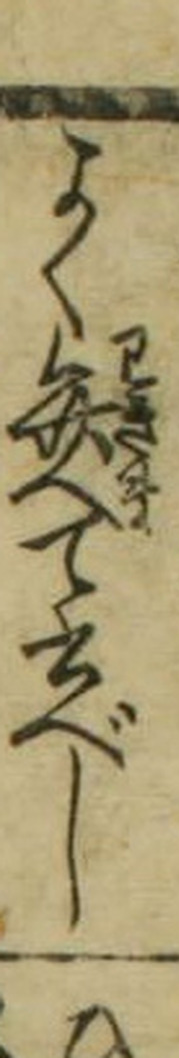よく弁へて書べし
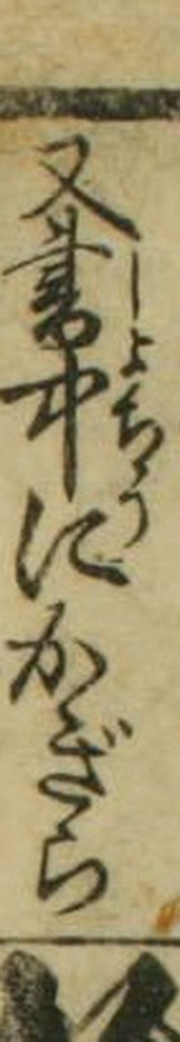又書中にかぎら
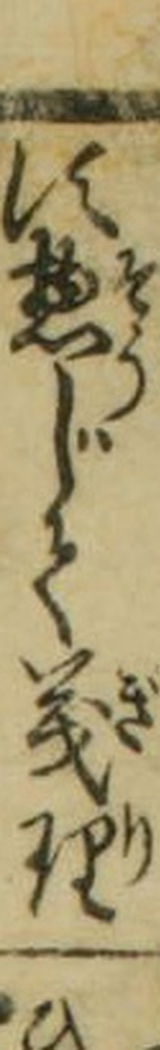す惣じて義理
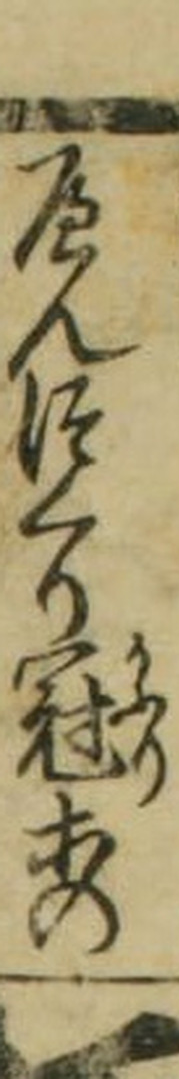へんつくり冠等の
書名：増補職人往来
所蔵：東京学芸大学教育コンテンツアーカイブ
